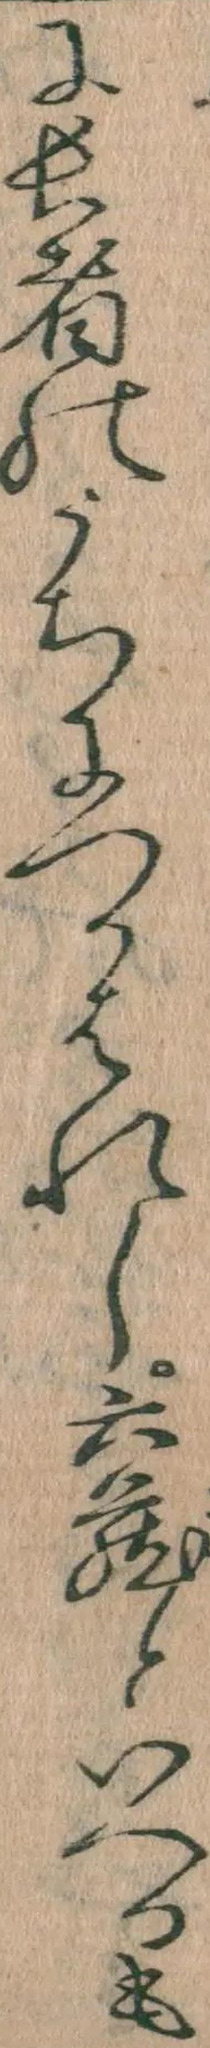に長者のうちにつかはれし。六蔵といへるも
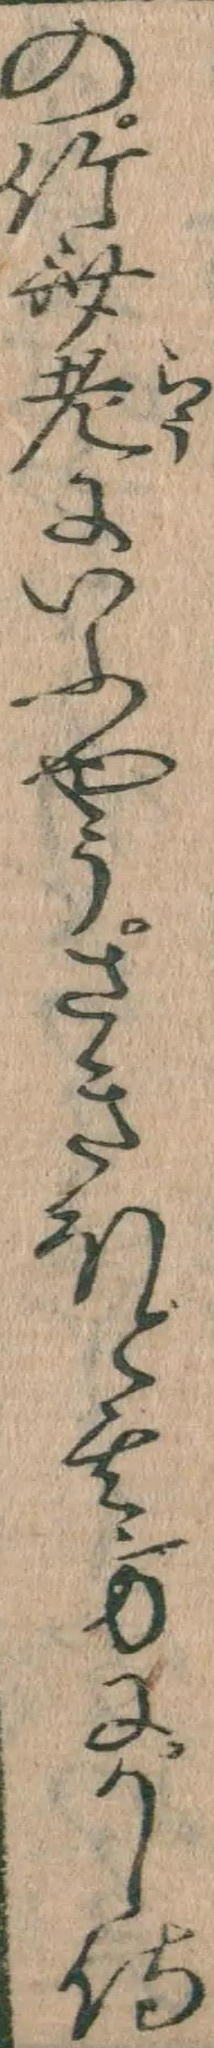の。竹斎老にいふやう。さきほと其方に。かし侍
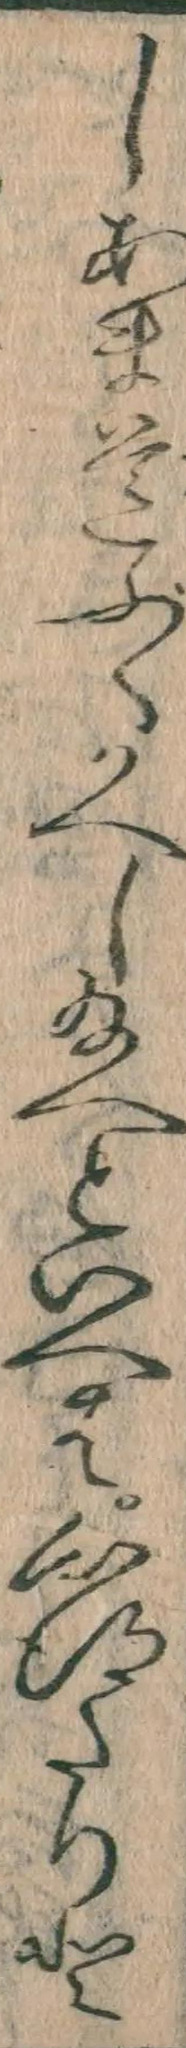しあま道ぶくかへし給へといへは。心得たりと
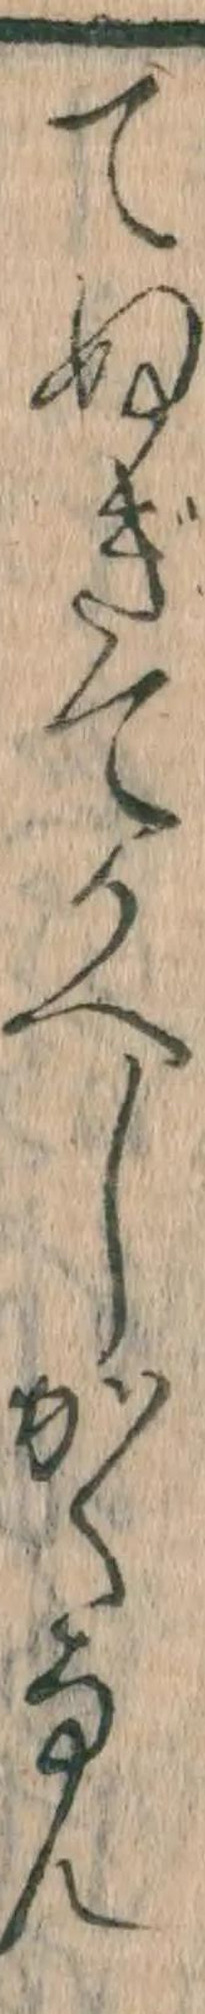てぬぎてかへしかくなん
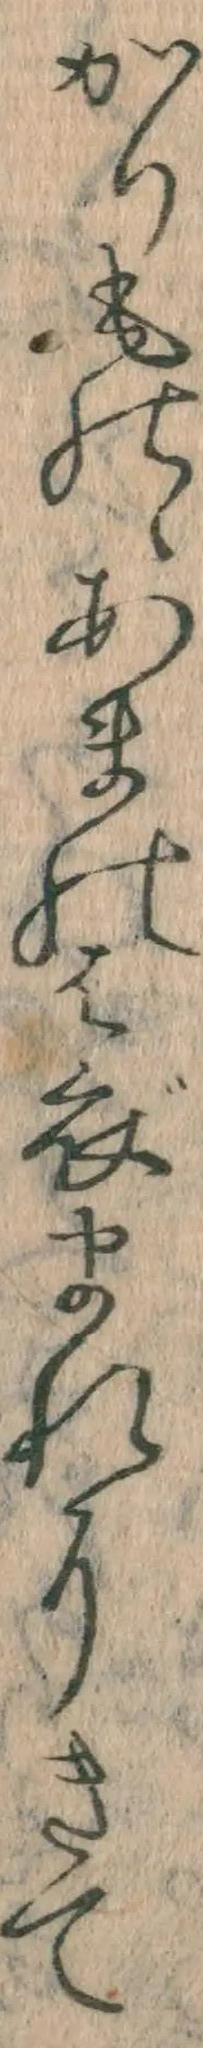かりものゝあまのは”衣まれにきて
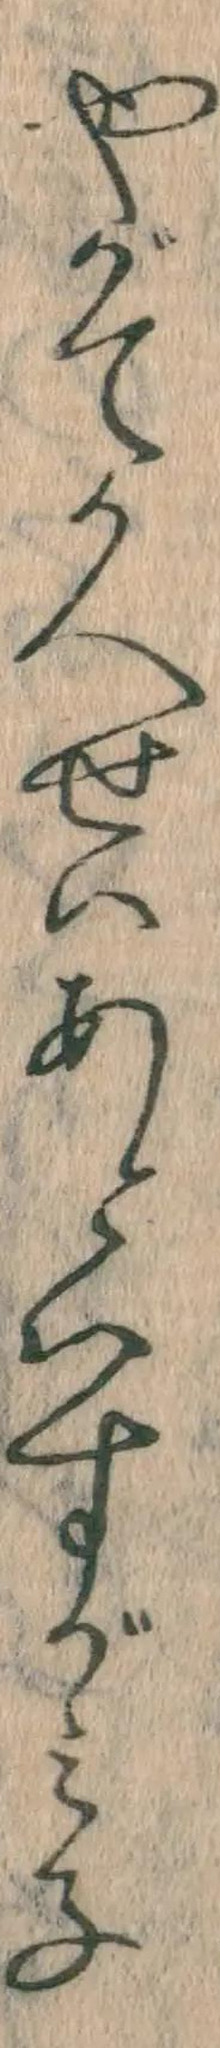やがてかへせはあとはすがみ子
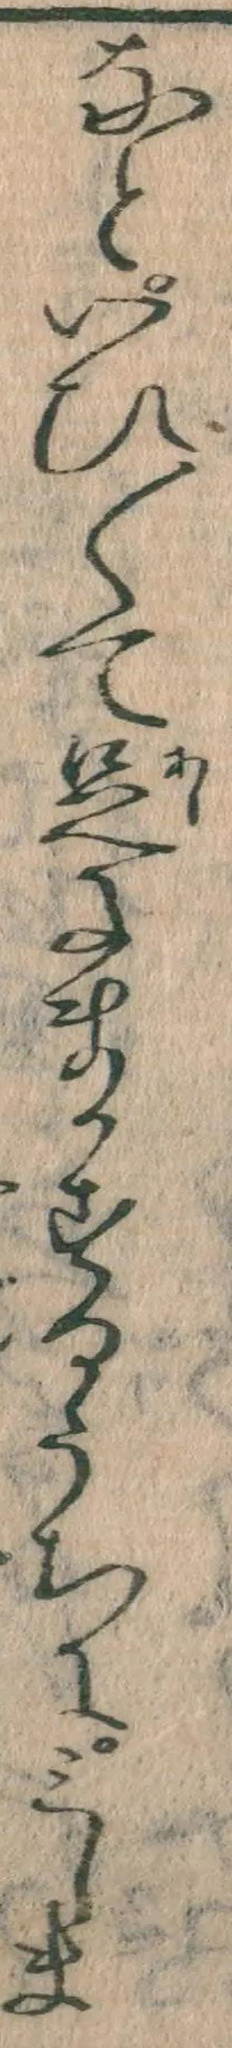なと。いひ〳〵て足にまかするうちに。みしま
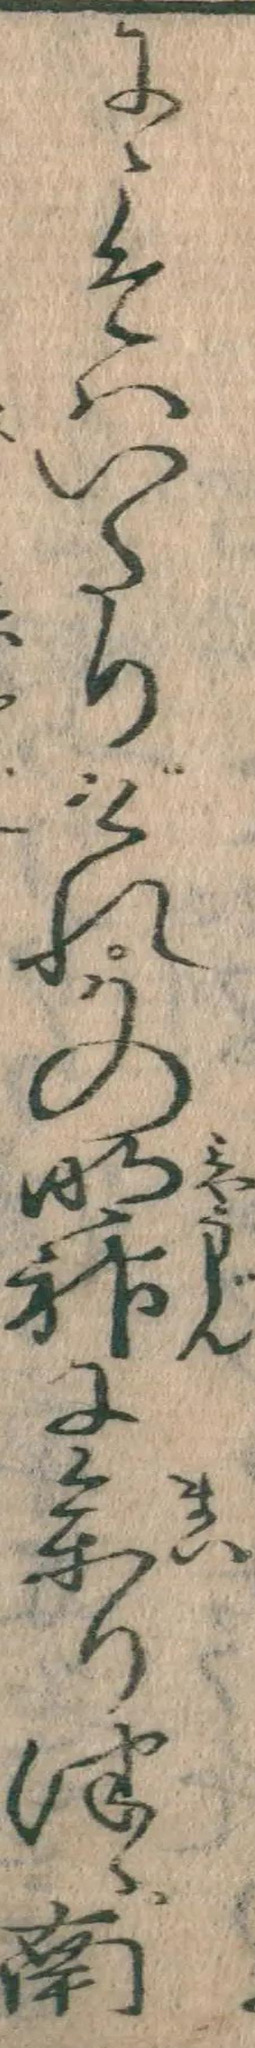にこそはいたりげれ。かの明神に参りつゝ。南
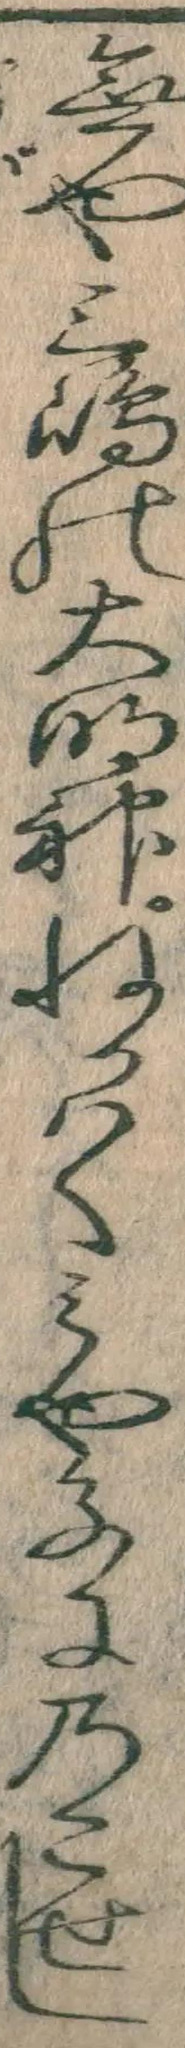無や三島の大明神。ねかはくみやこにのこせし
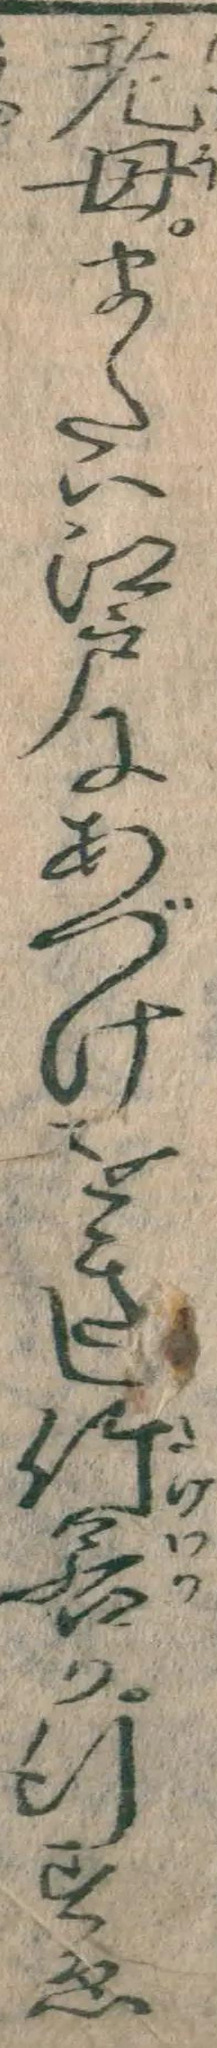老母。または江戸にあづけをきし竹若か。行すゑ
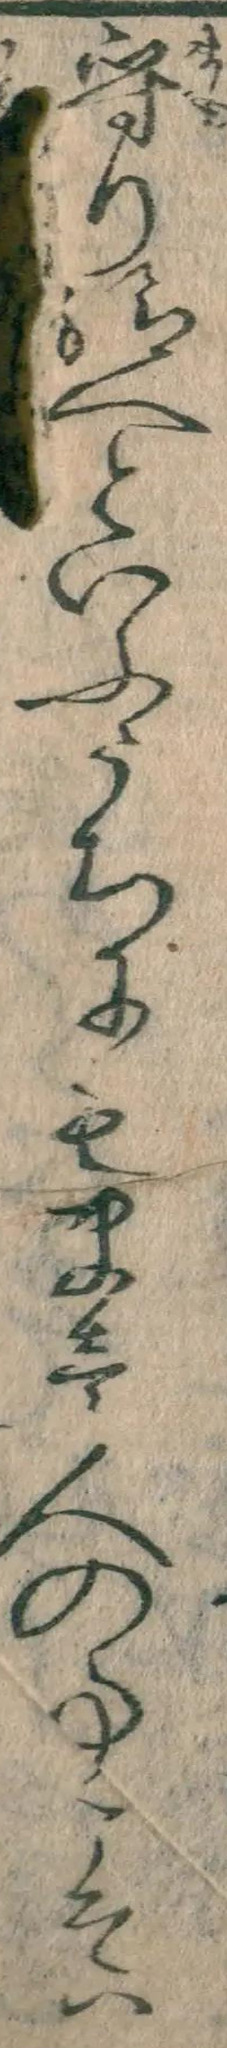守り給へといふうちにもま人の事こそは
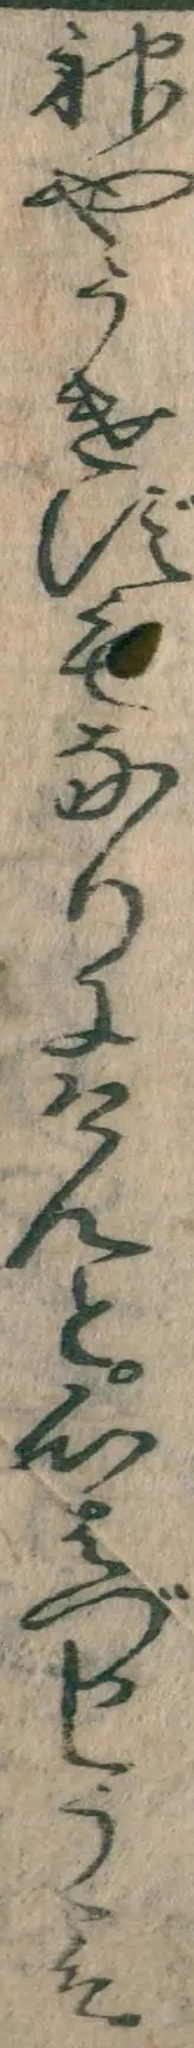神やうけずもなりにけんと。心はづかしうこそ

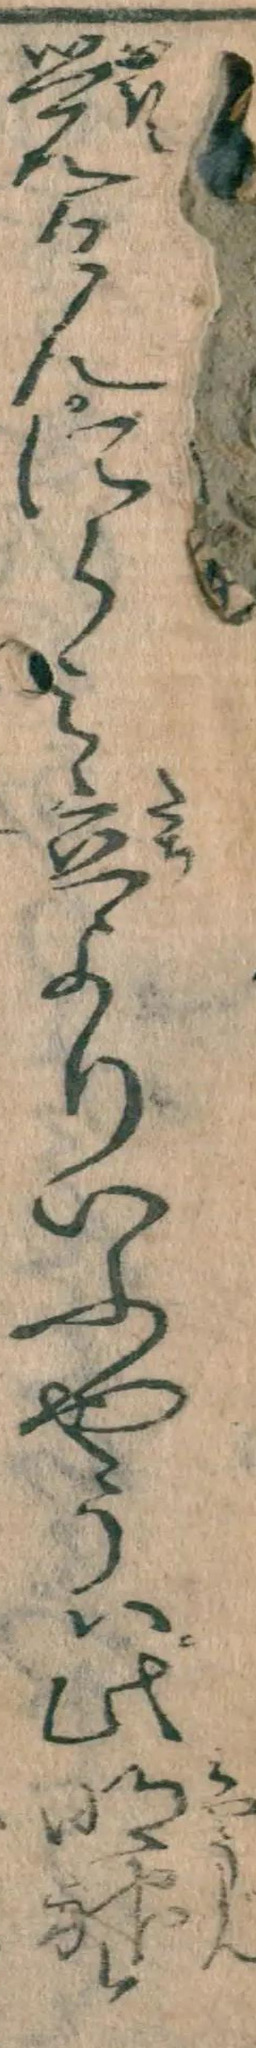覚けん。にらみ立よりいふやうは。此明神[と]
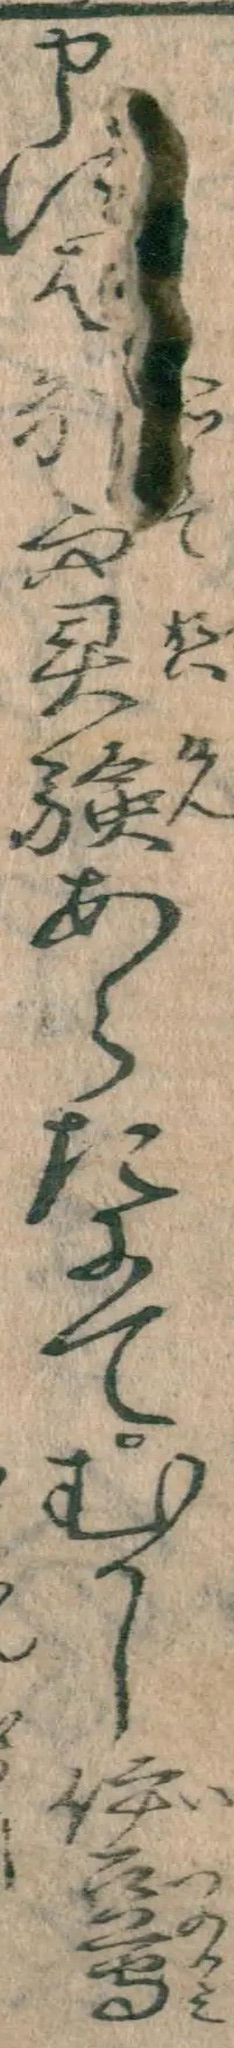申すは別而霊験あらたにて。むかし伊豆守
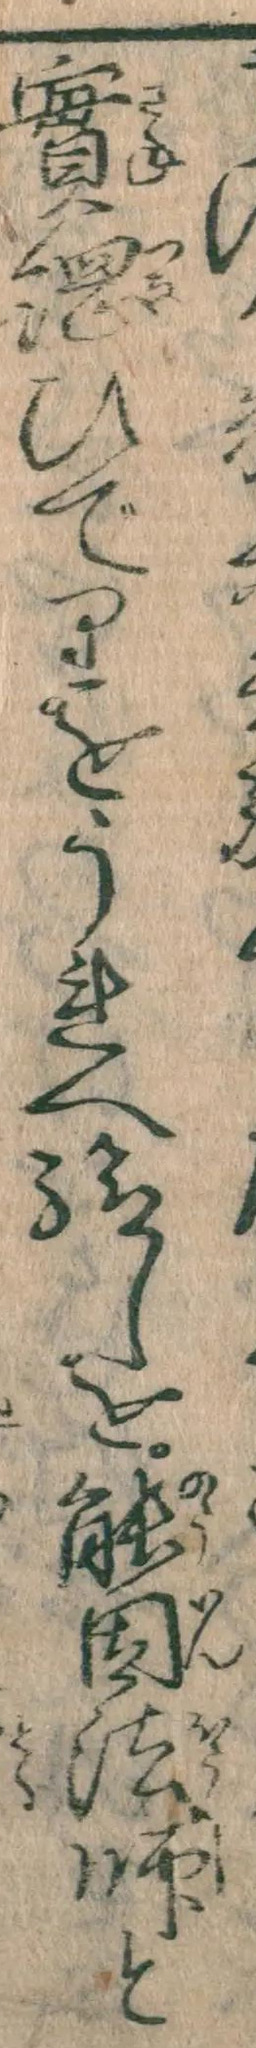実綱ひでりをうれへ給しを。能因法師と
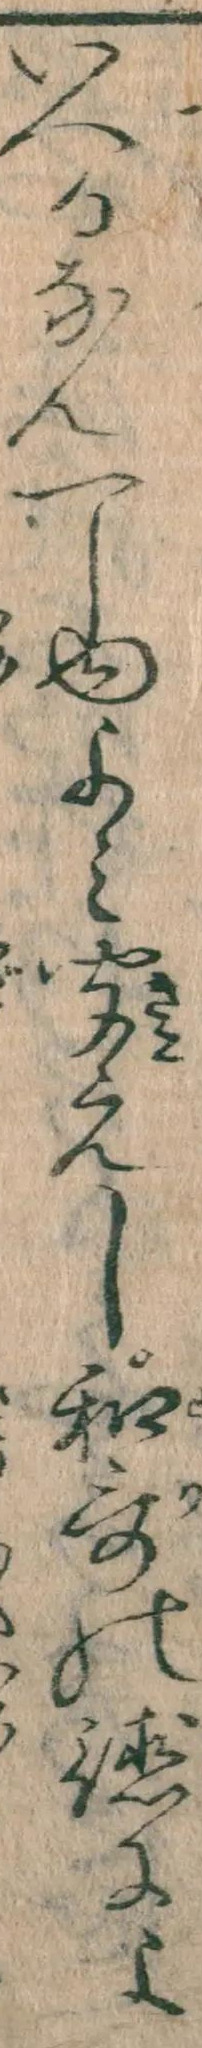いへるなん一しゆよみ聞えし。和哥の徳によ
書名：竹斎狂歌物語 3巻
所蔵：国立国会図書館 National Diet Library, JAPAN
